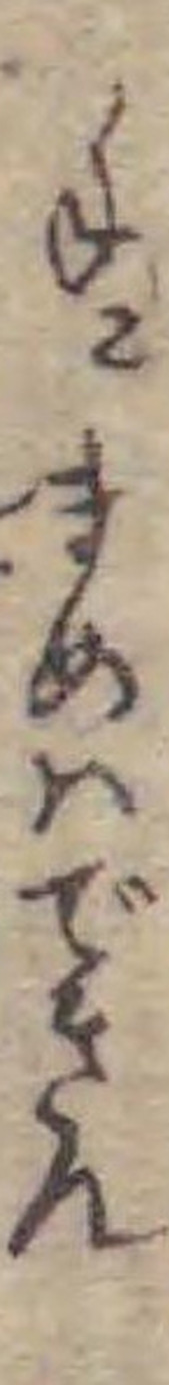手にまめはできん
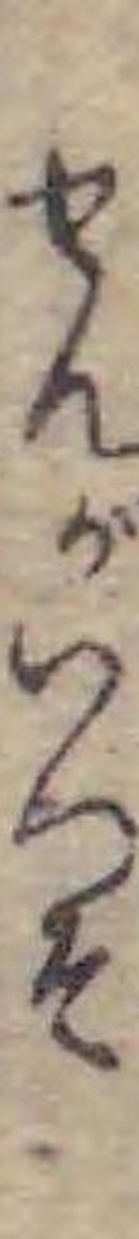せんがいつそ
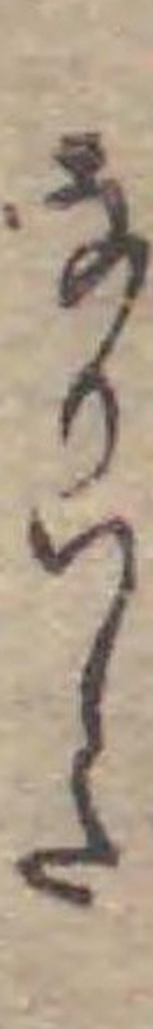なりいした
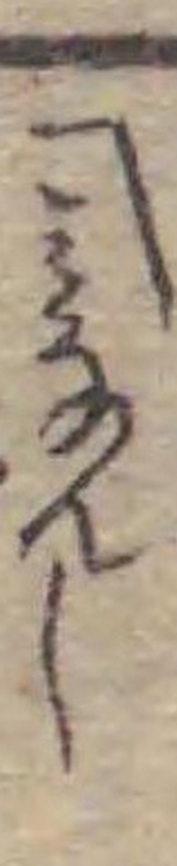〽みなんし
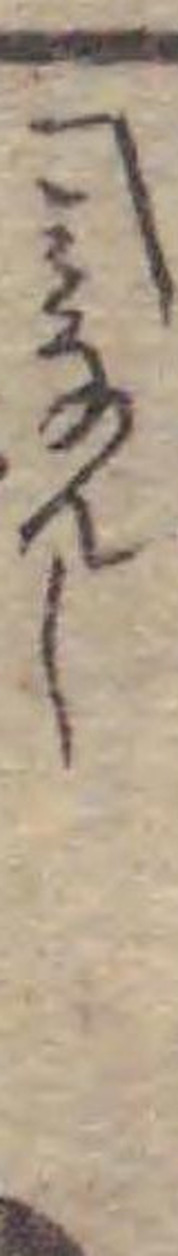〽みなんし
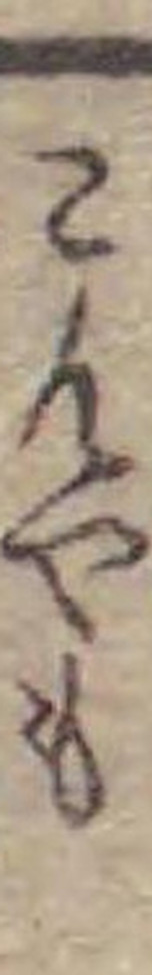こんやも
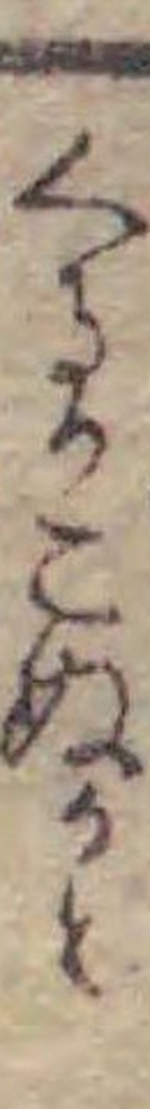くるか小ぬかを
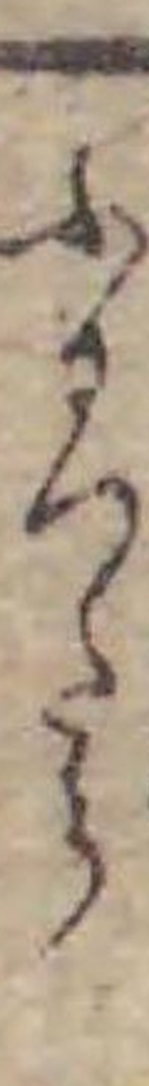ふるつたら
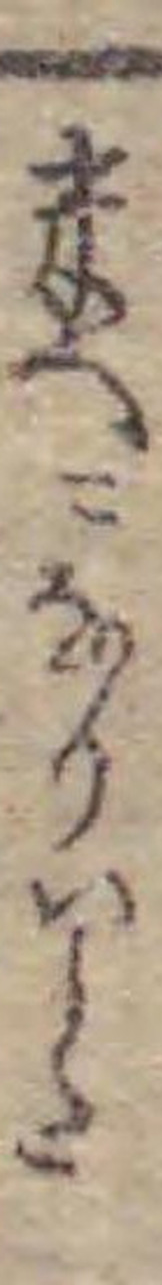米へになりいした
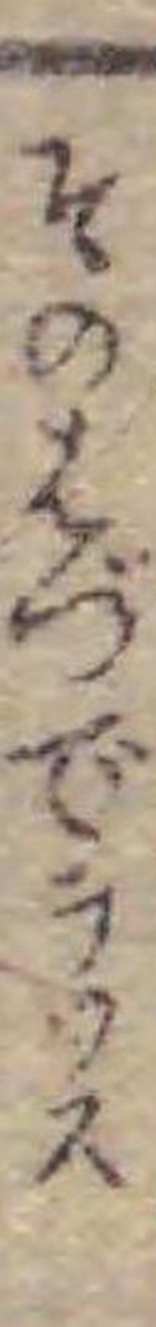そのはづでヲツス
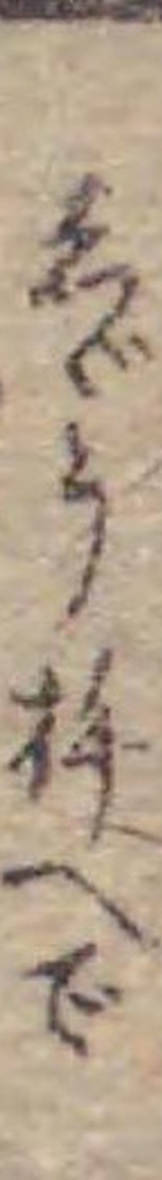しゞう杵へで
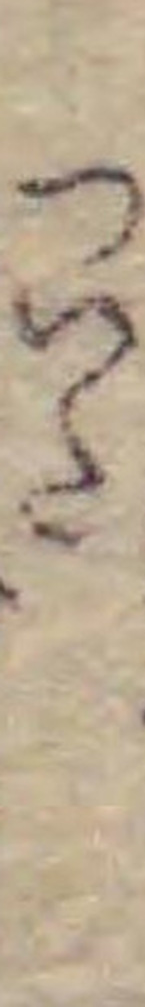ついた
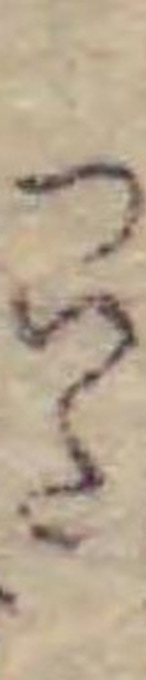ついた
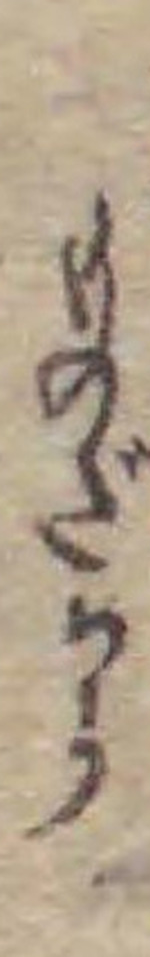ものだから

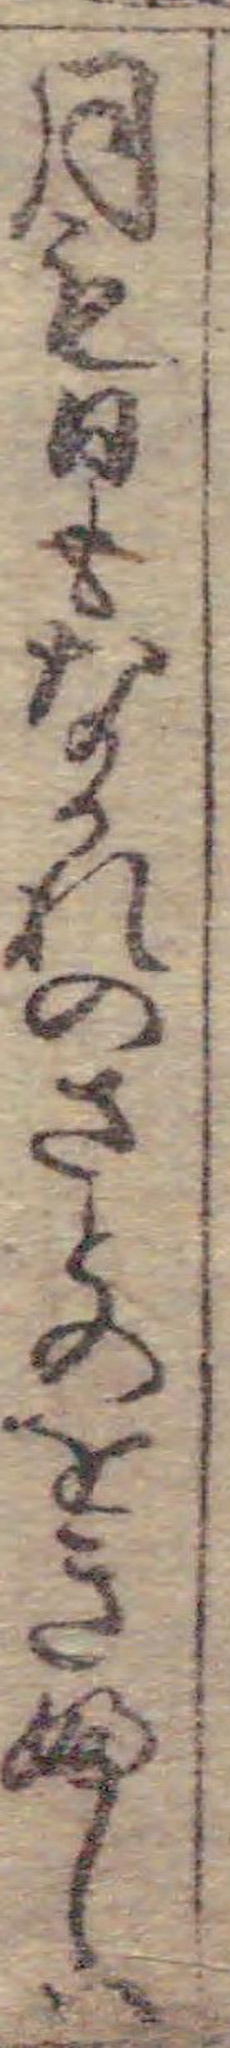月も日もなかれのさとのをきふしは
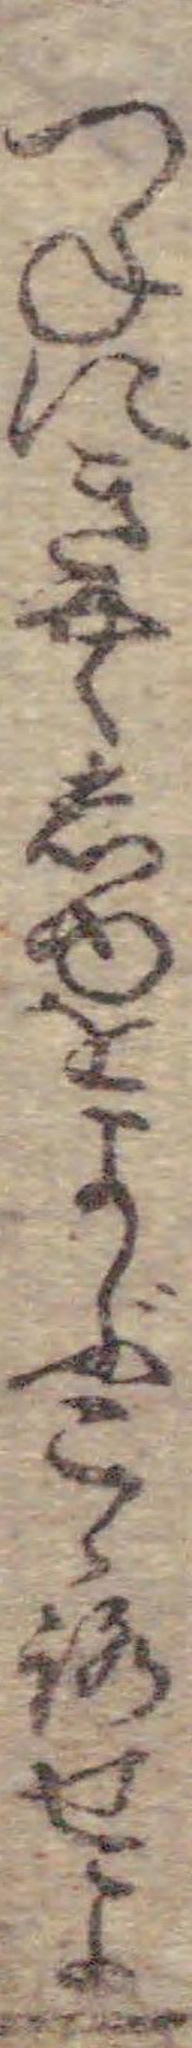つねにきやくしゆをよぶこゝろせよ
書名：北国順礼唄方便 : 3巻
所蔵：国立国会図書館 National Diet Library, JAPAN
